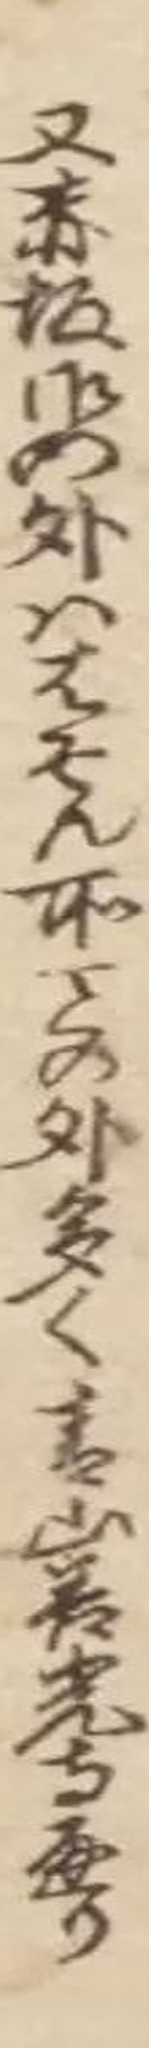又赤坂御門外ははそん所ことの外多く青山善光寺通り
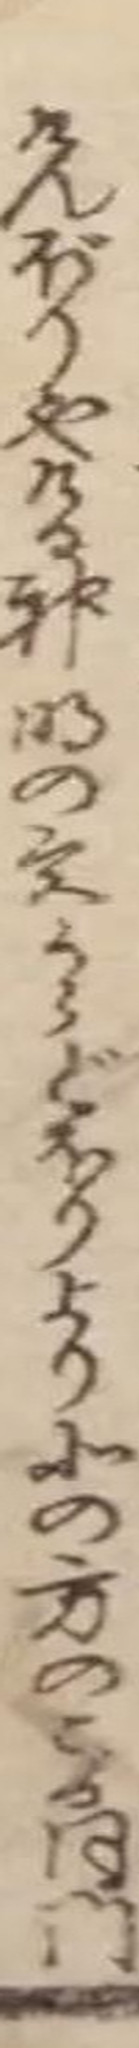けんぼりやける神明の宮くらどほりより北の方のこる同門
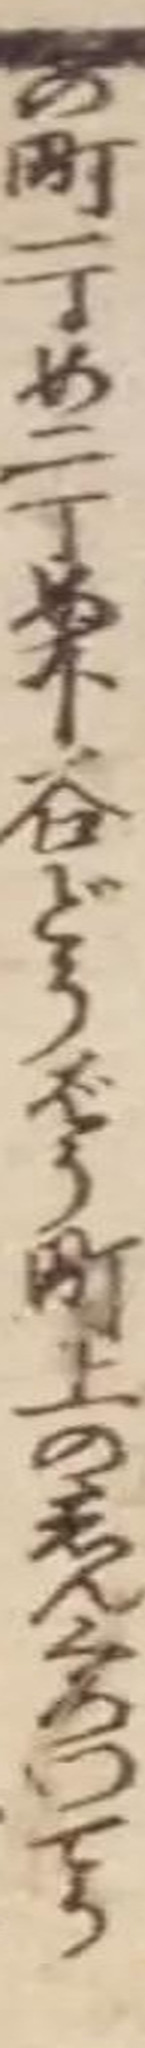の町一丁め二丁め下谷どうばう町上のしんくろ門てう
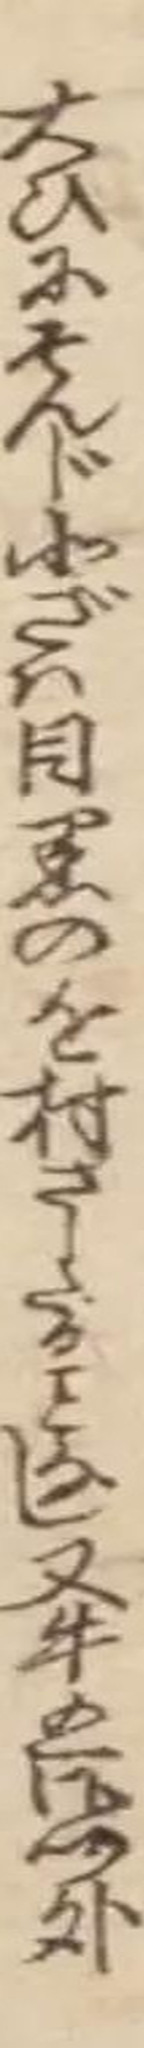大ひにそんじ所ざは目黒の近村さしだる事なし又牛込御門外
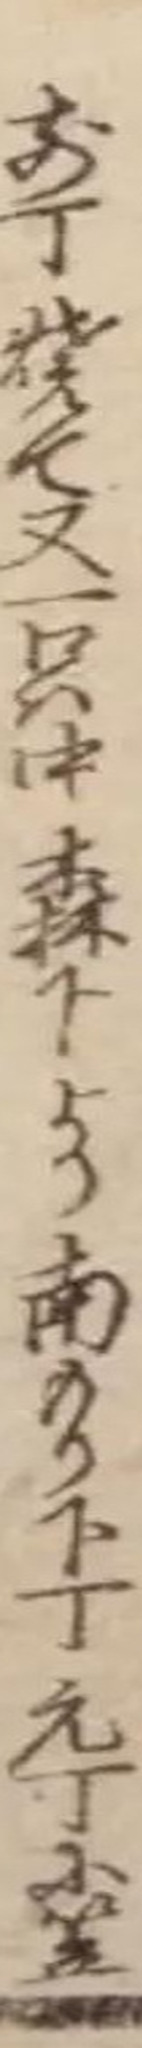前丁焼て又一口は中森下より南もり下丁元丁に笠
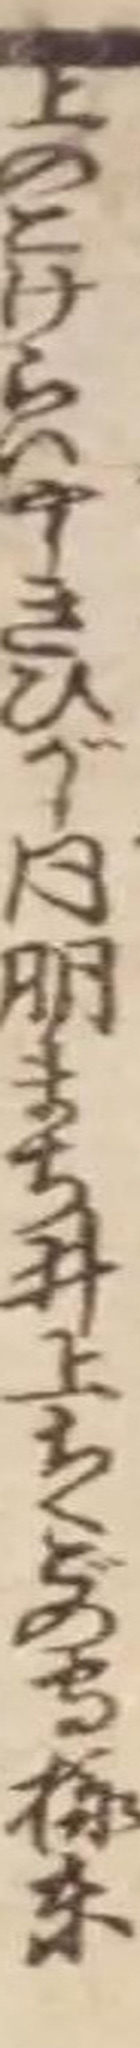上のこけらいやしきひがし同朋まち井上ちくごの守様東
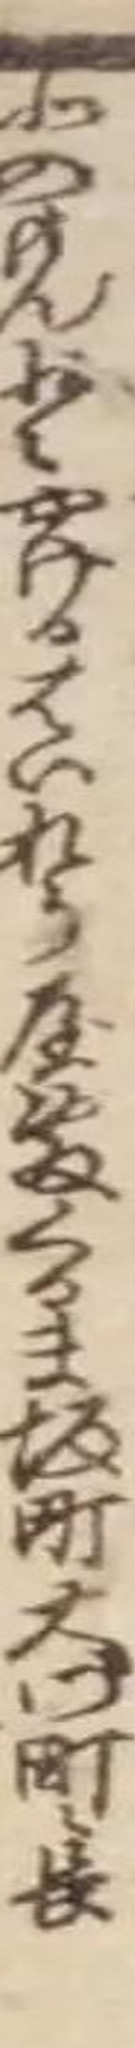北のもん少〻やけるはいれう屋敷くるま坂町大門町〻長
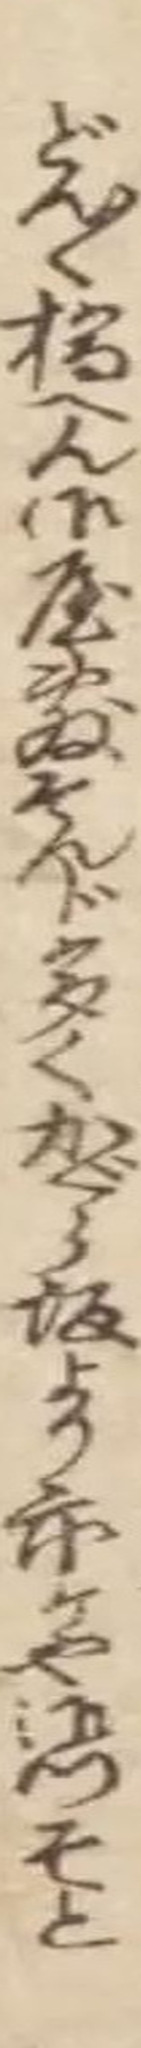どん〳〵橋へん御屋敷そんじ多くかぐら坂より市ヶや御門そと
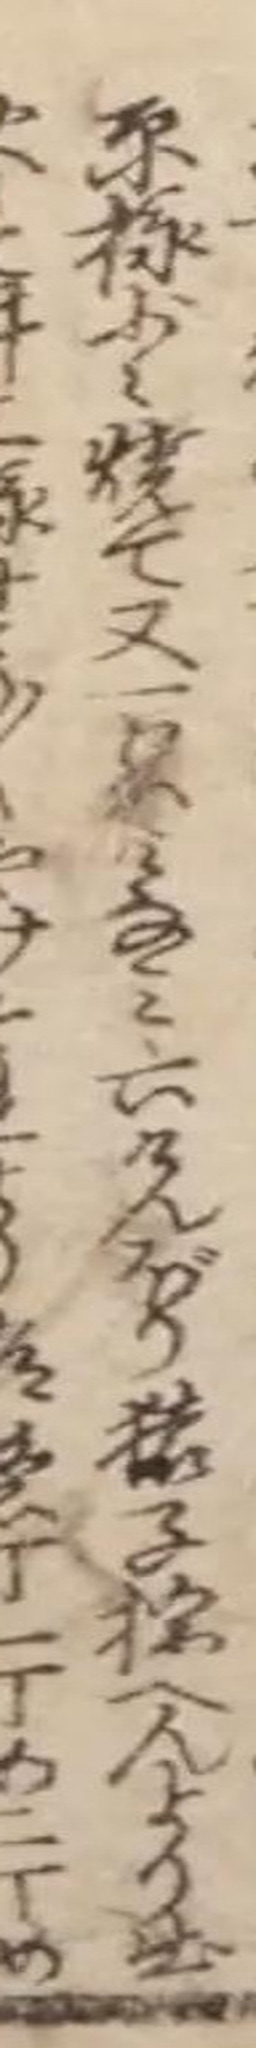火して井上様せう〳〵やけそれより常磐丁一丁め二丁め
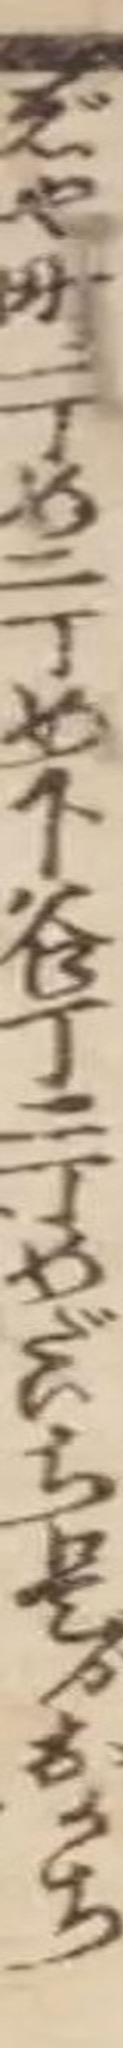じや町一丁め二丁め下谷丁二丁めだいち是よりおかち
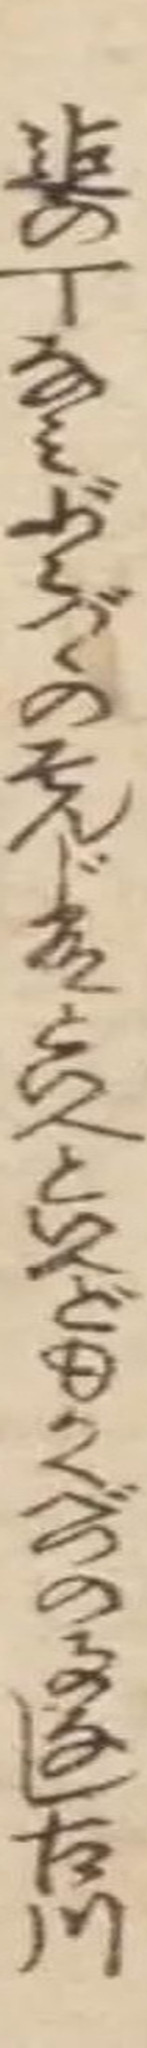迄の丁なみ少〃づゝのそんじ有といへといへどもかくべつの事なし古川
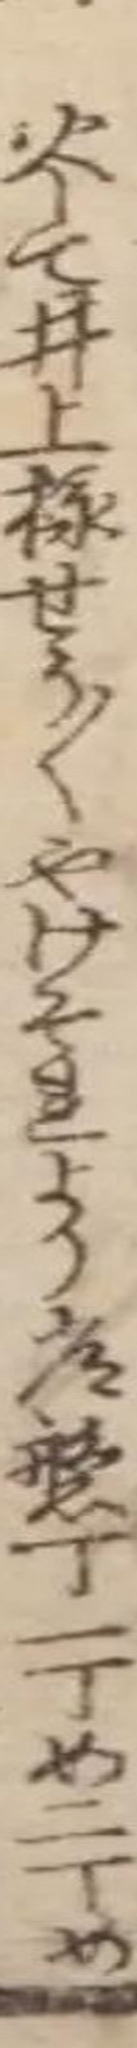火して井上様せう〳〵やけそれより常磐丁一丁め二丁め
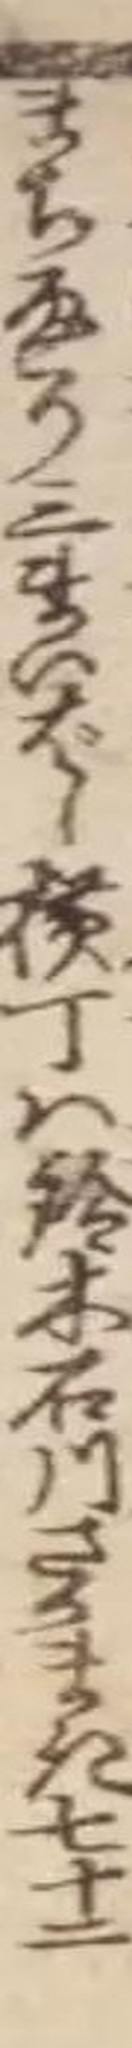まち通り三まいばし横丁は鈴木石川さかまき七十二
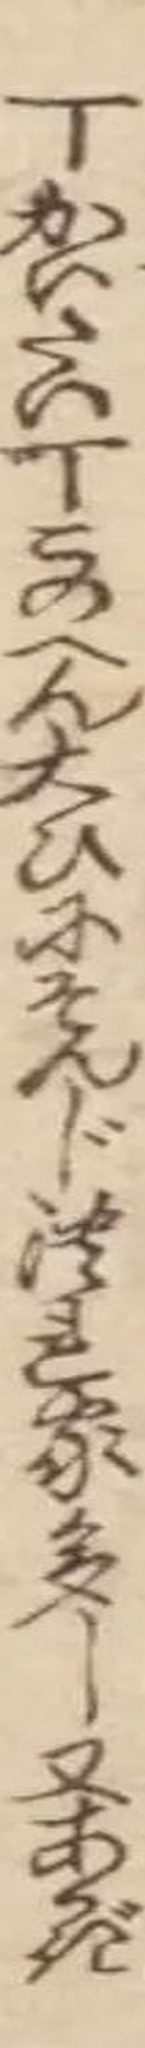丁かいたい丁このへん大ひにそんじ潰れいえ多し又あかぎ
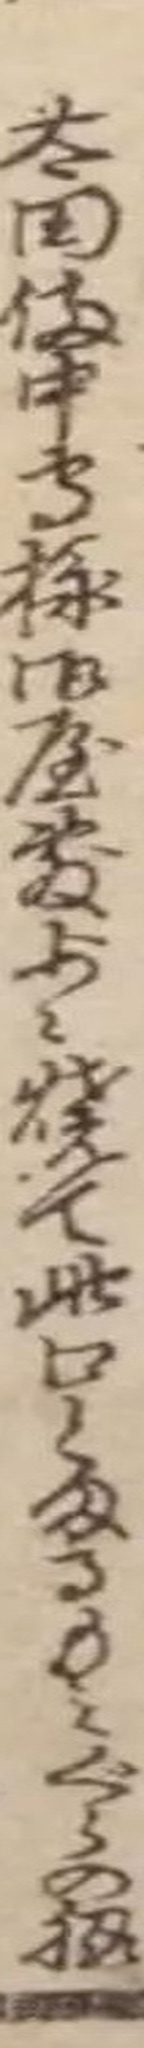太田備中守様御屋敷少々焼て此口とまるもみぐらの脇
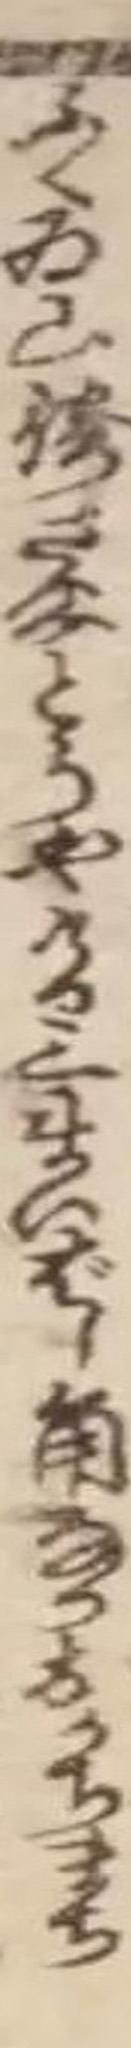ふくゐ山崎さまとうやける三まいばし角なかおかちまち
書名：関東大地震末代鑑
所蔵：国立国会図書館 National Diet Library, JAPAN
